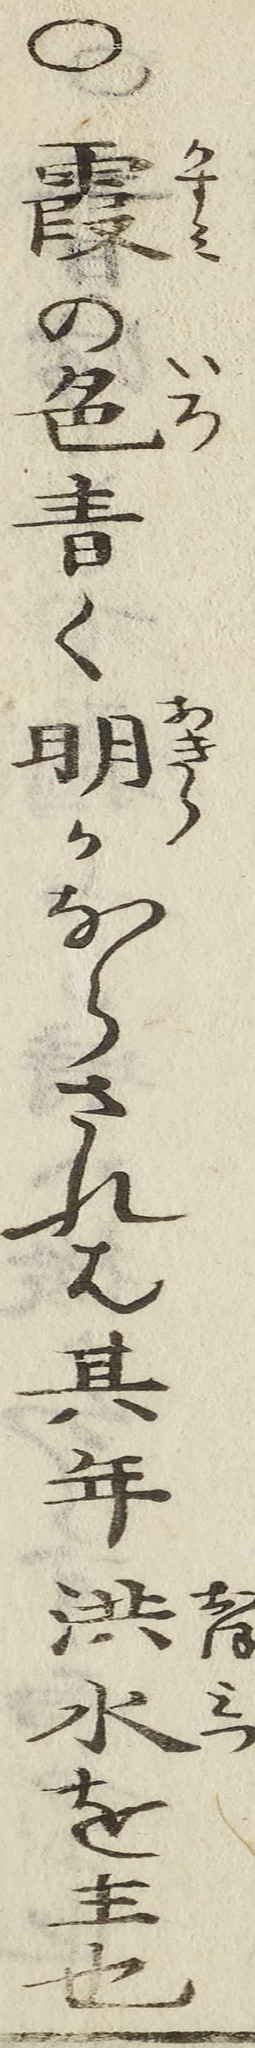〇霞の色青く明かならされは其年洪水を主也
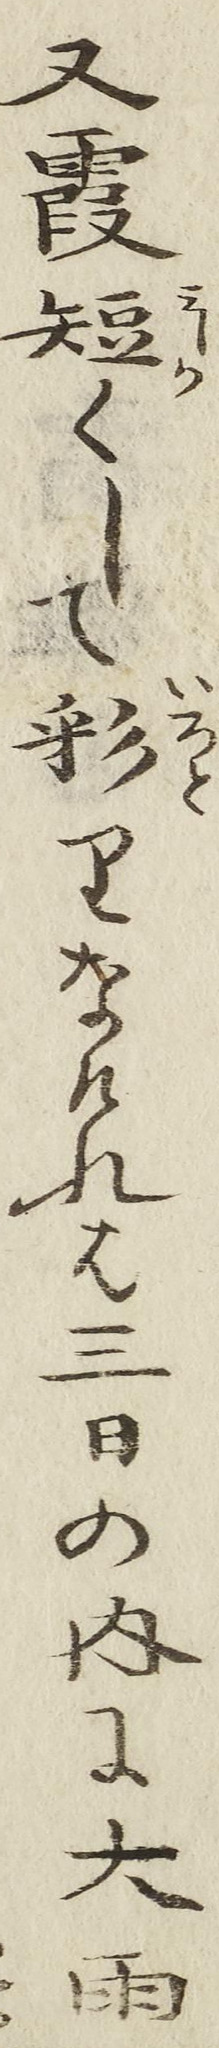又霞短くして彩りなけれは三日の内に大雨
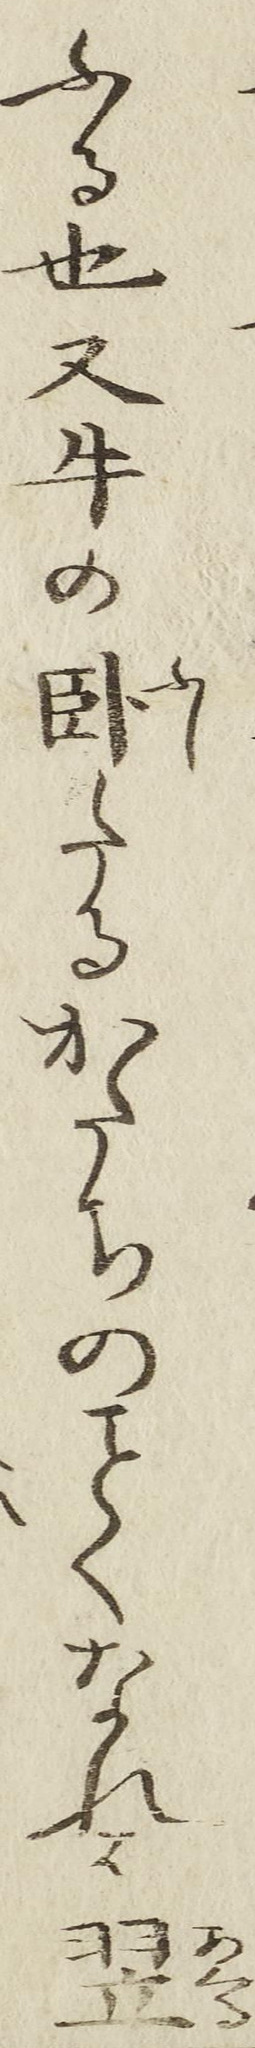ふる也又牛の臥たるかたちのことくなれは翌
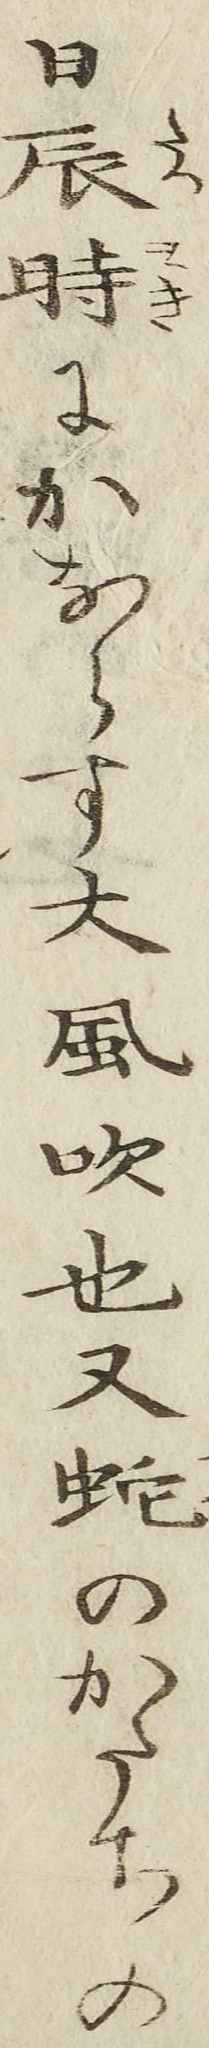日辰時にかならす大風吹也又蛇のかたちの
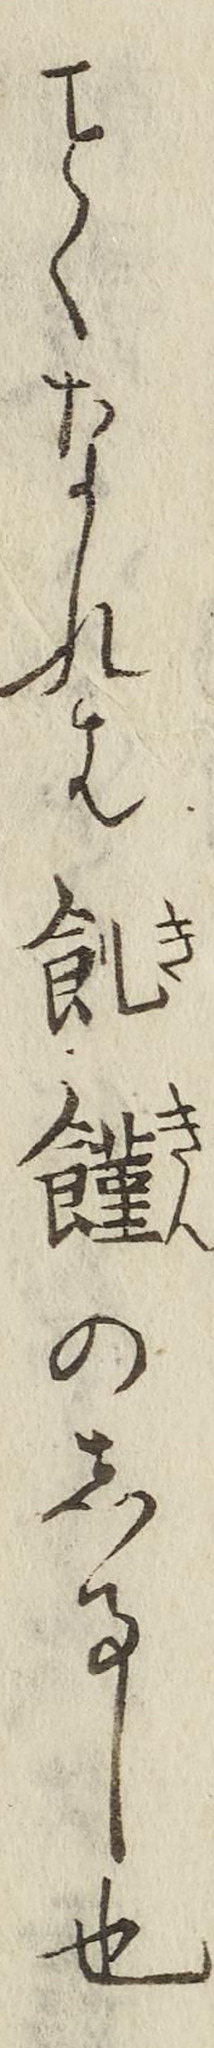ことくなれは飢饉のしるし也

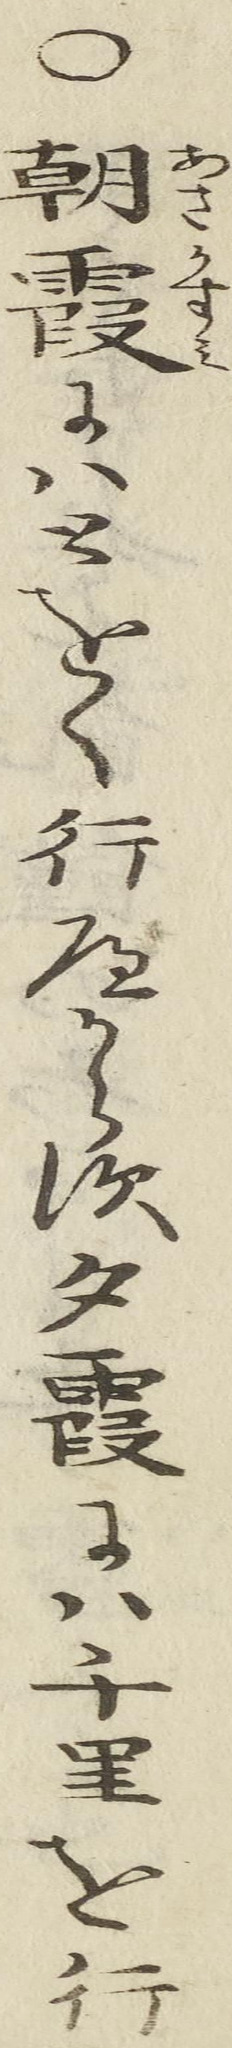〇朝霞にはとをく行へからす夕霞には千里を行
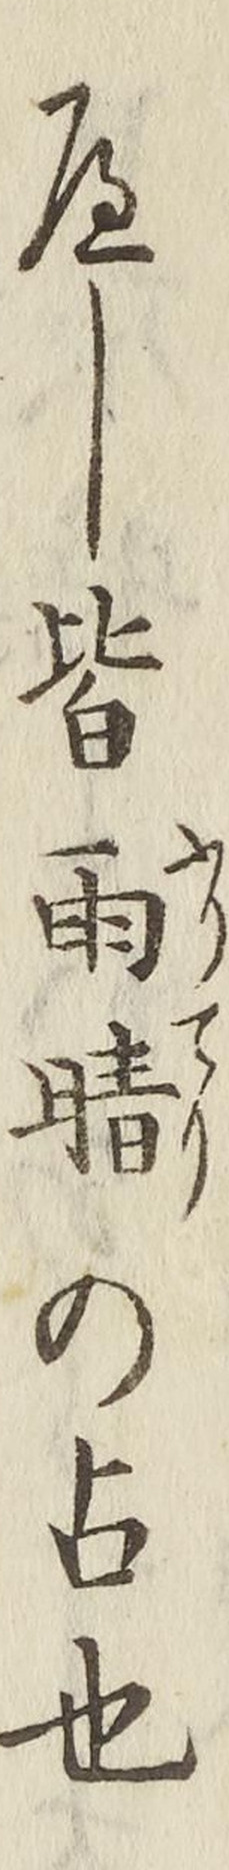へし皆雨晴の占也
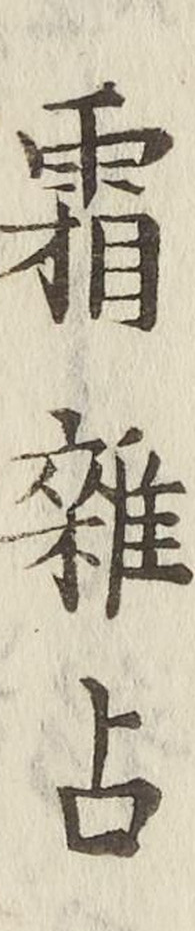霜雑占
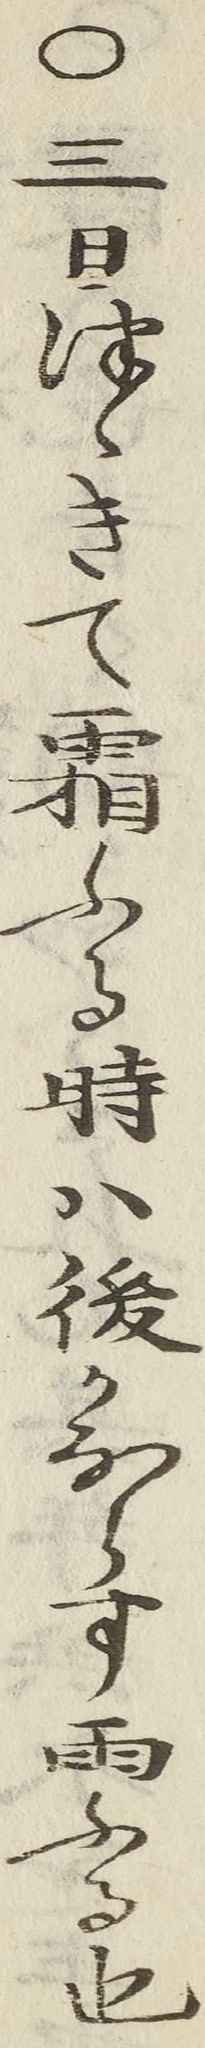〇三日つゝきて霜ふる時は後かならす雨ふる也
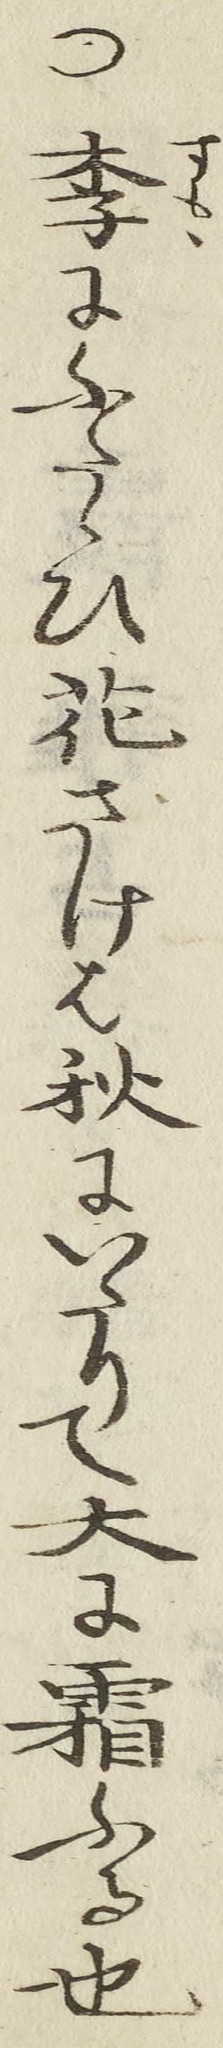〇李にふたゝひ花さけは秋にいたりて大に霜ふる也
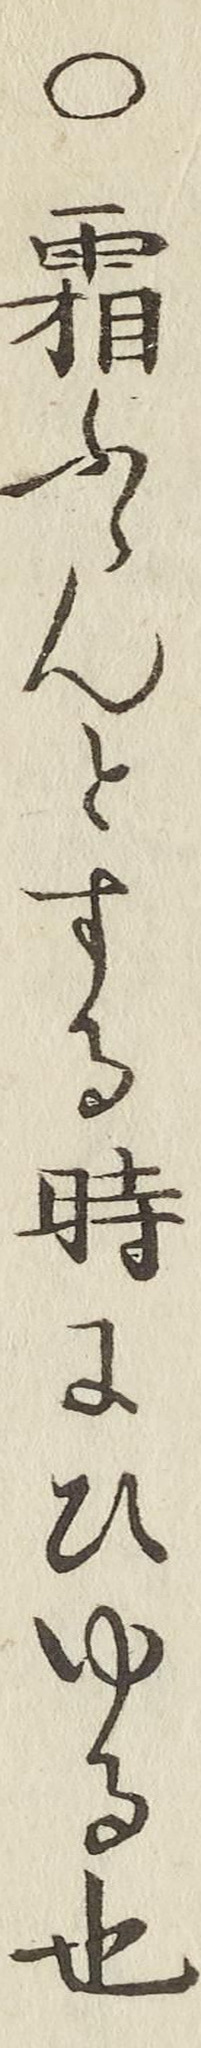〇霜ふらんとする時にひゆる也
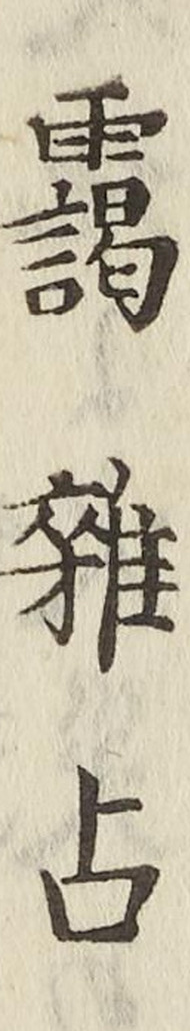靄雑占
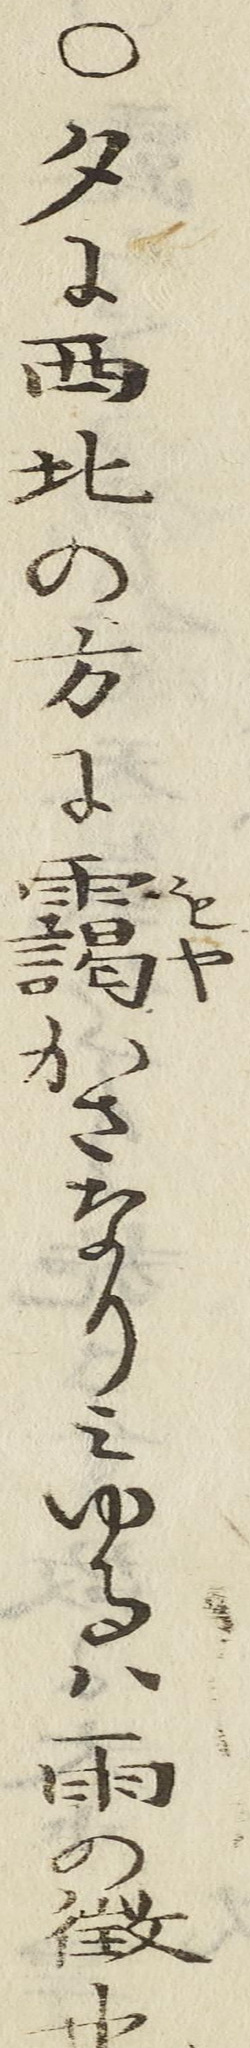〇夕に西北の方に靄かさなりみゆるは雨の徴也
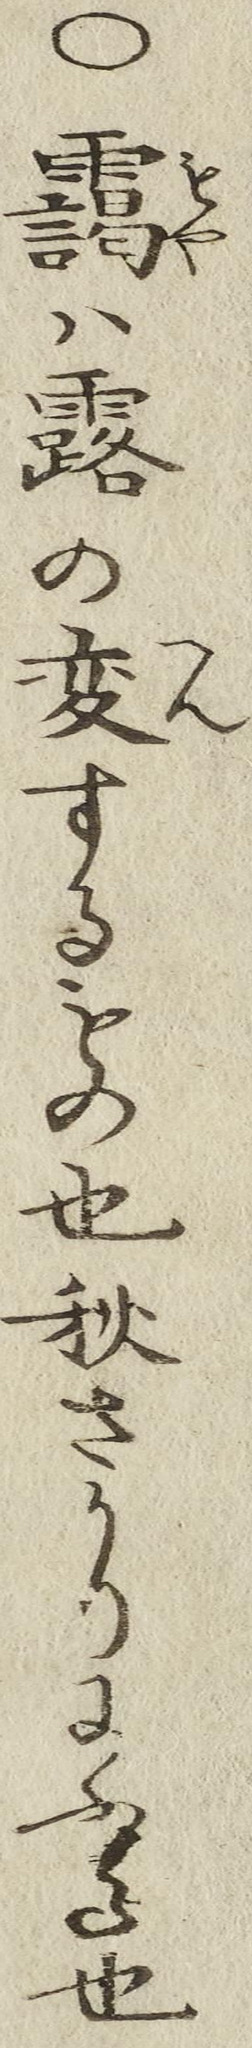〇靄は露の変するもの也秋さかりにふる也
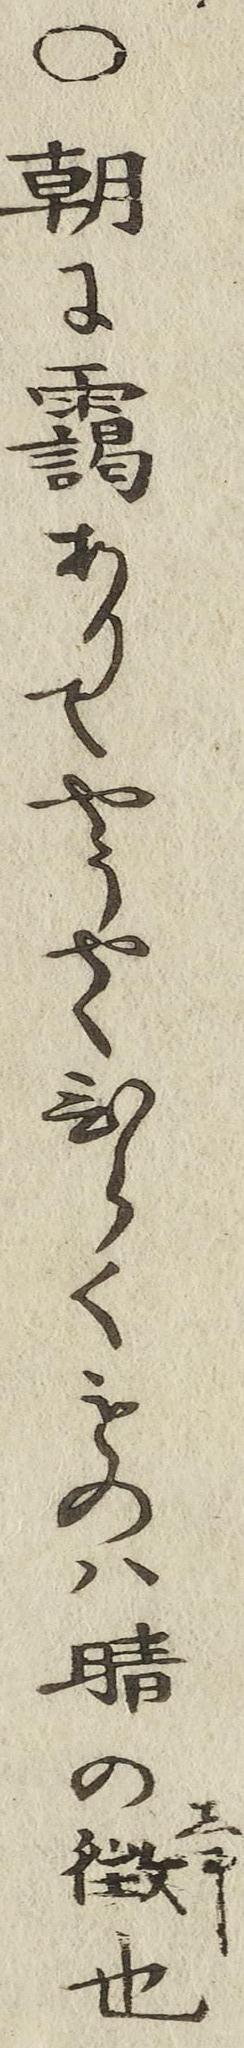〇朝に靄ありてやうやくひらくものは晴の徴也
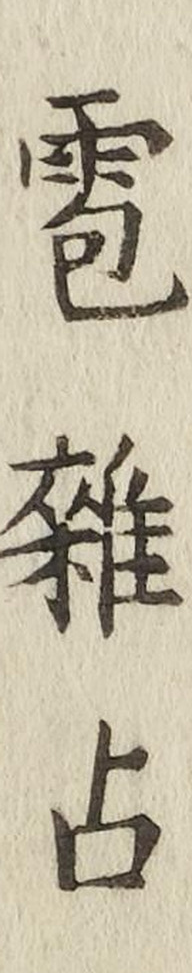雹雑占
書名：天時占候　二
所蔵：東京大学地震研究所図書室 Earthquake Research Institute Library, The University of Tokyo, JAPAN
